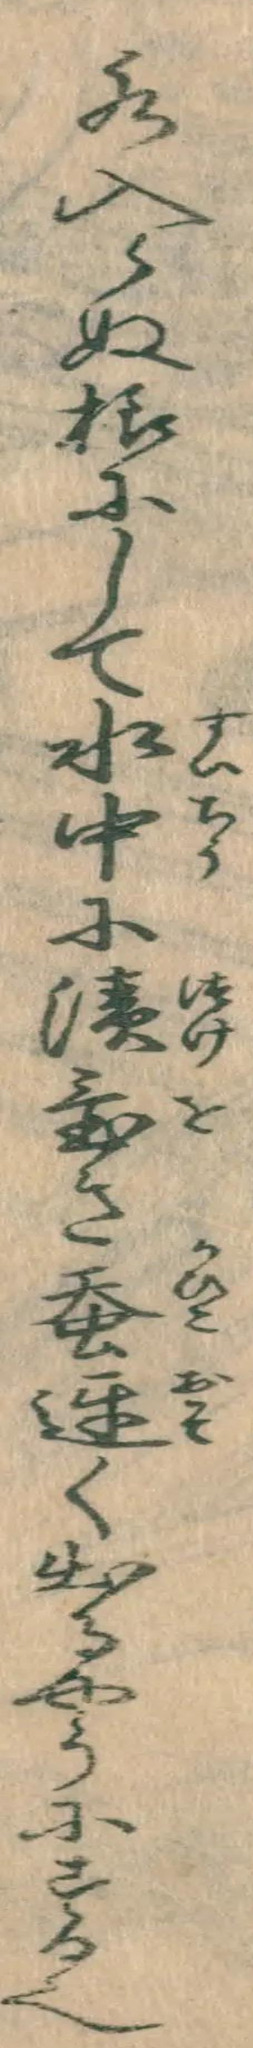水入らぬ様にして水中に漬置き蚕遅く出るやうにする也
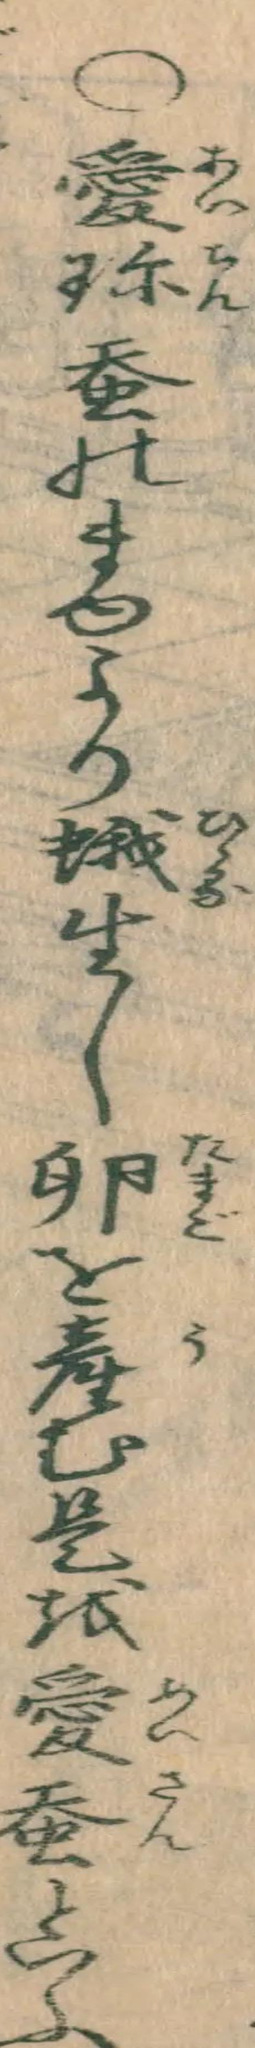○愛珍蚕のまゆより蛾生し卵を産む是を愛蚕といふ
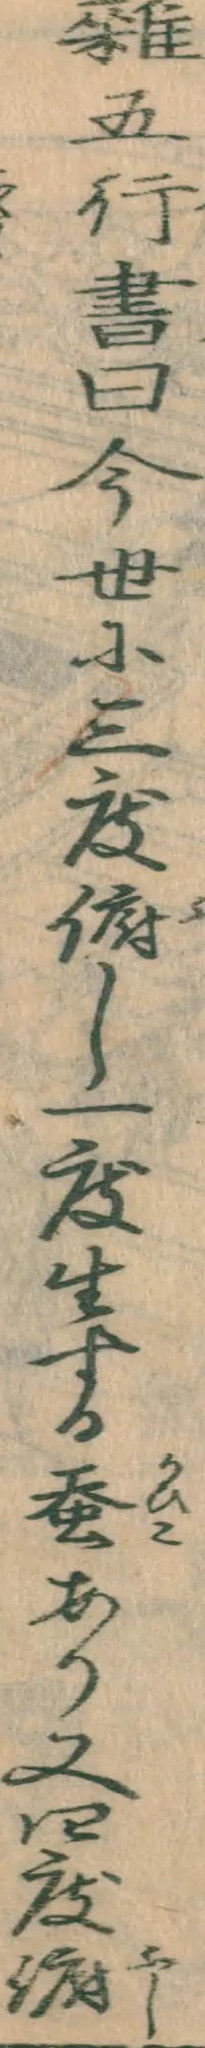雑五行書曰今世に三度俯し一度生する蚕あり又四度俯
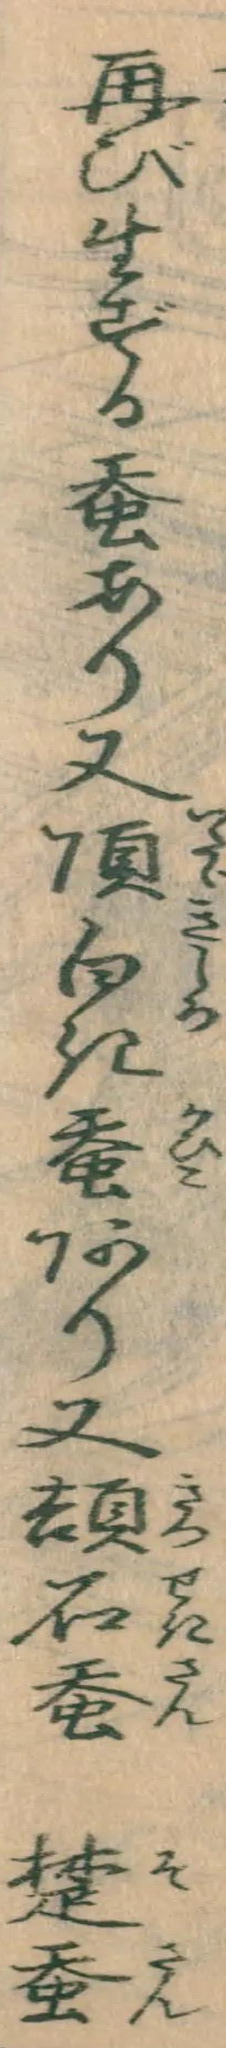再び生ずる蚕あり又頂白き蚕あり又頡石蚕楚蚕
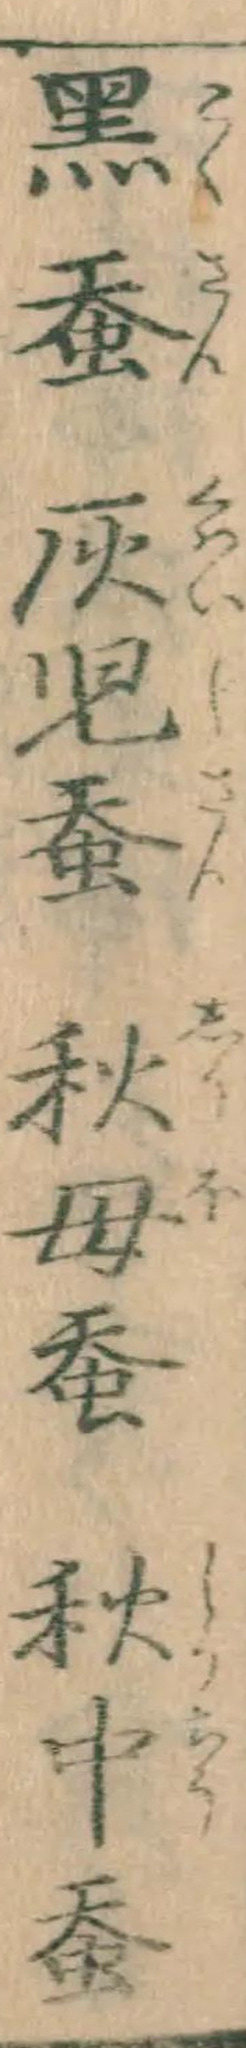黒蚕灰児蚕秋母蚕秋中蚕
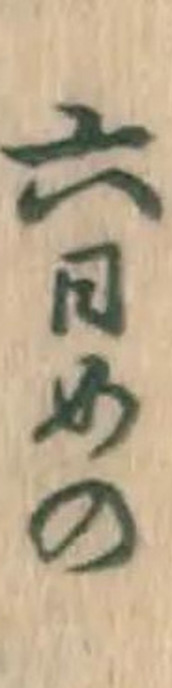六日めの
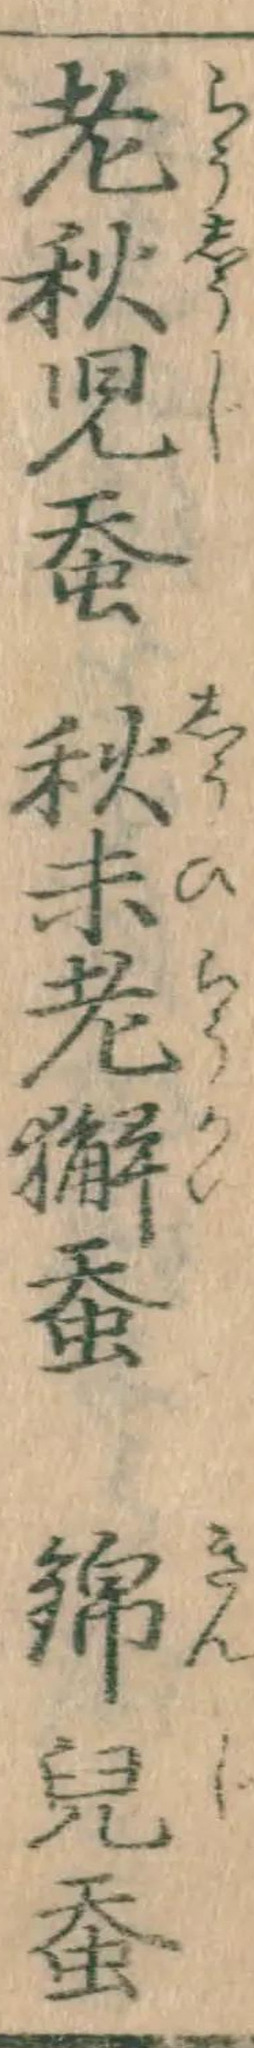老秋児蚕秋末老獬蚕錦児蚕
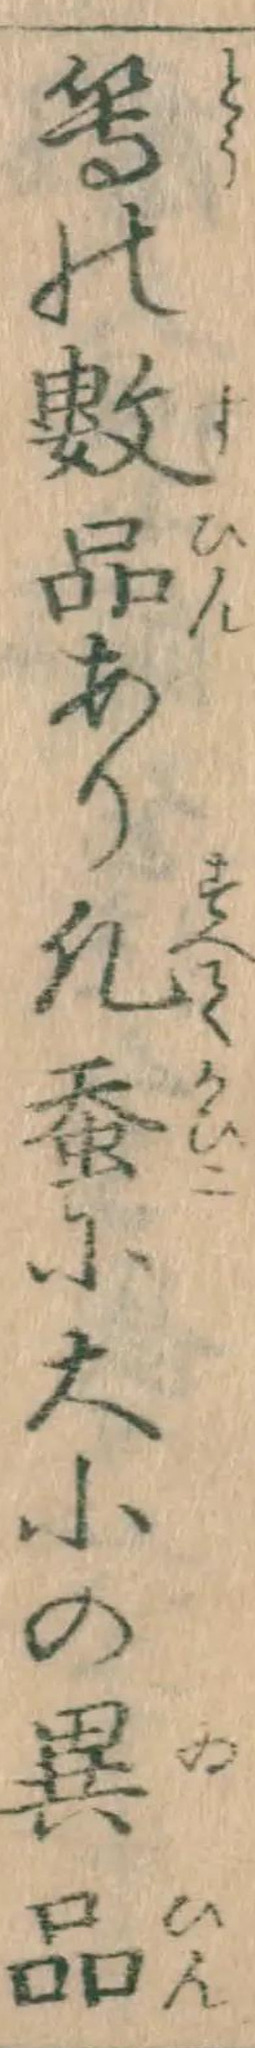等の数品あり凡蚕に大小の異品
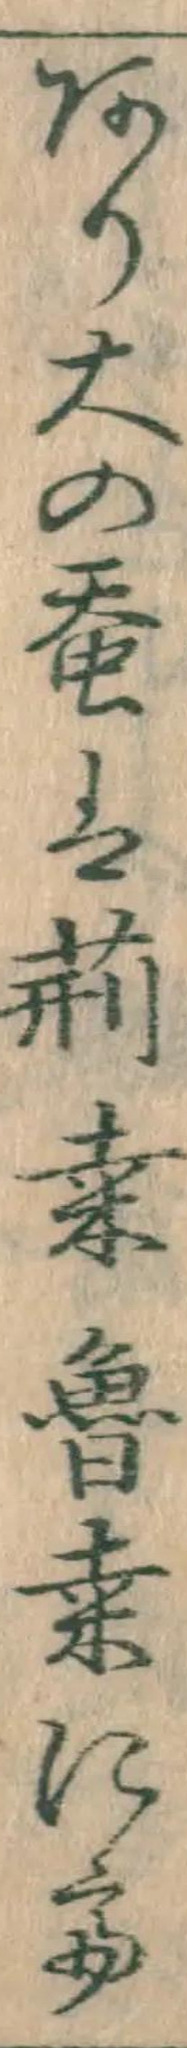あり大の蚕は荊桑魯桑にて
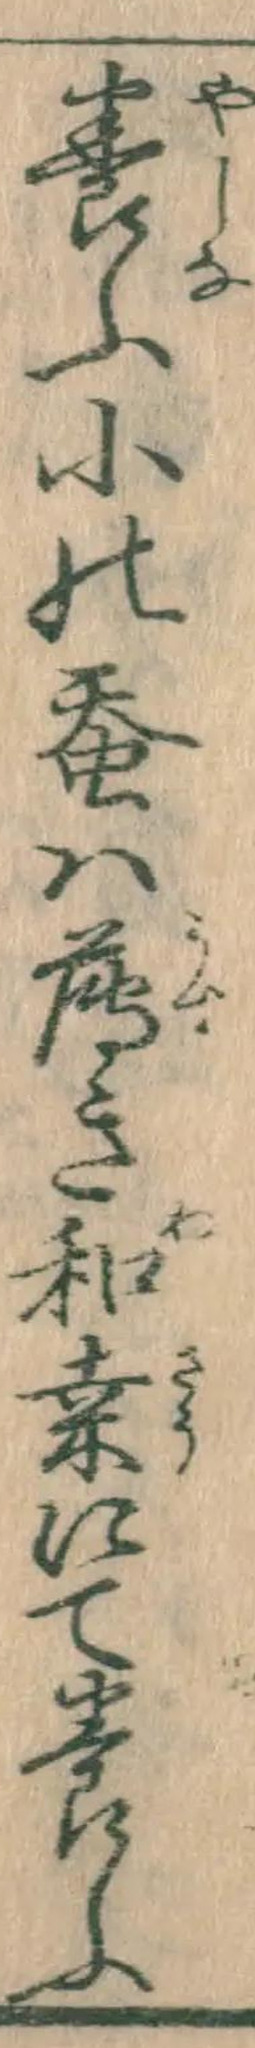養ふ小の蚕は薄き和桑にて養ふ
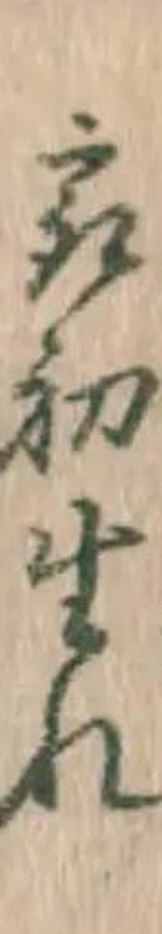最初生れ
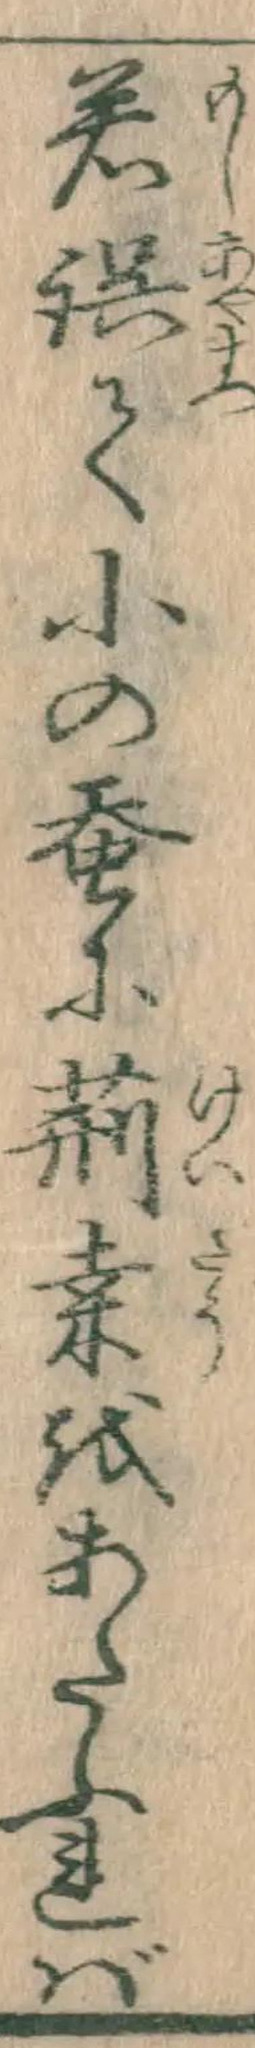若誤て小の蚕に荊桑をあたふれば
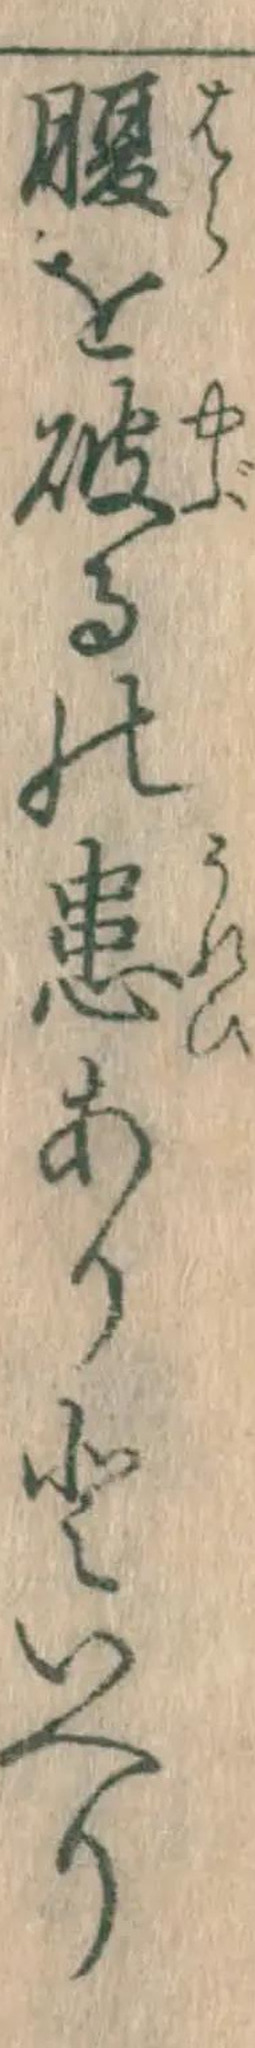腹を破るの患ありといへり
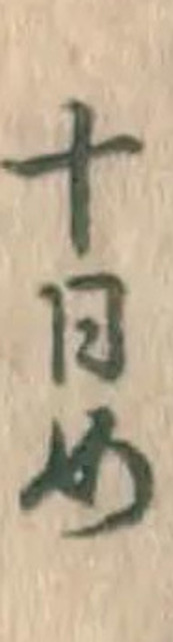十日め
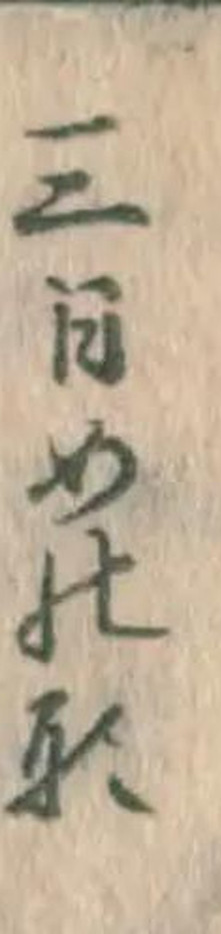三日めの形
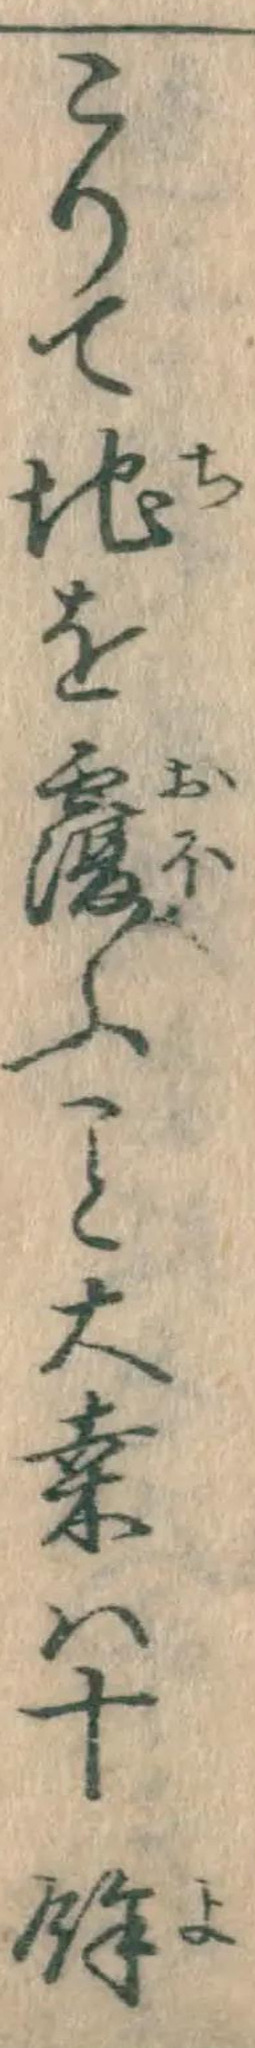こりて地を覆ふこと大桑は十余
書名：養蚕秘録 3巻. [1]
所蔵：国立国会図書館 National Diet Library, JAPAN
